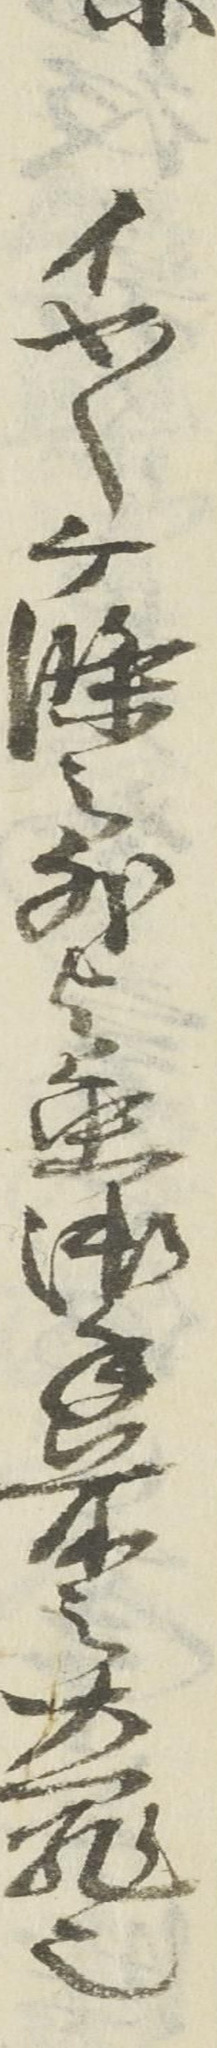小イヤ〳〵ケ條之外と雖御手前之大罪也
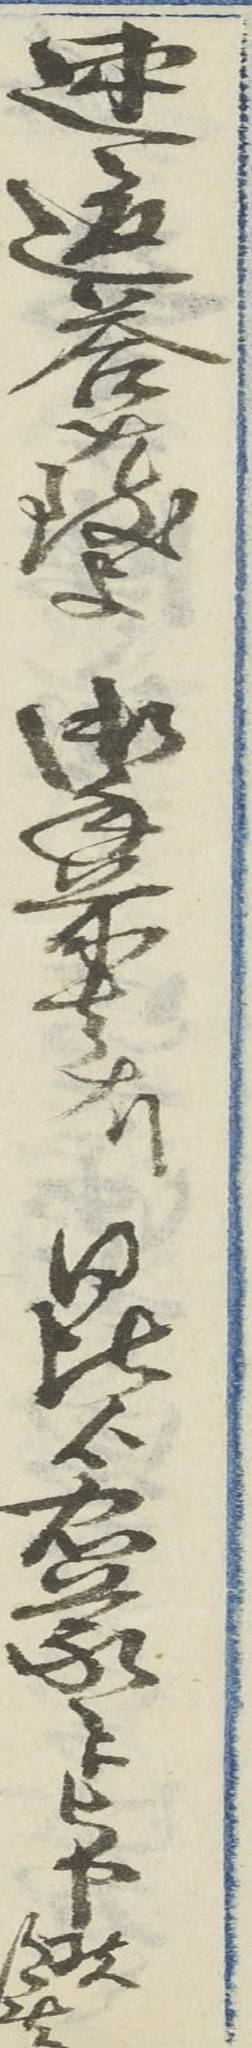速ニ返答ヲ致よ御手前はナ日比ゟ忠義ト被申候得共
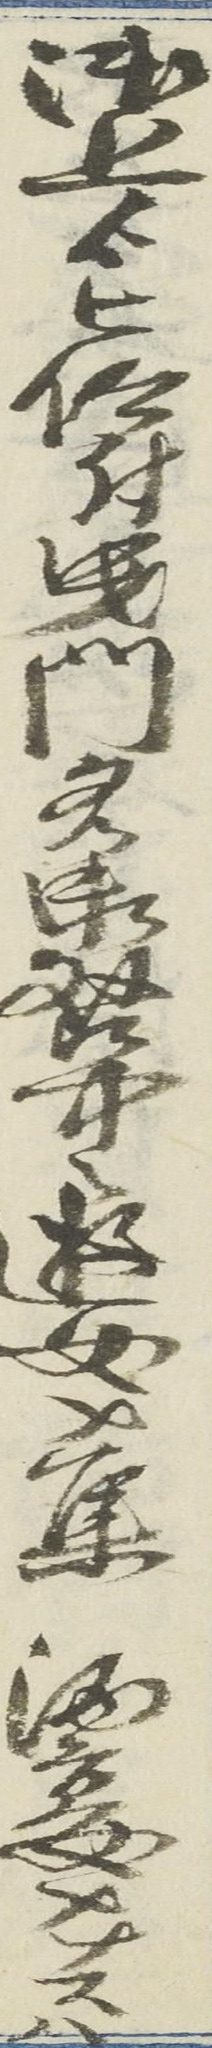御上ゟ被仰付閉門タル？御咎中二遊女ヲ集酒宴ヲナスハ
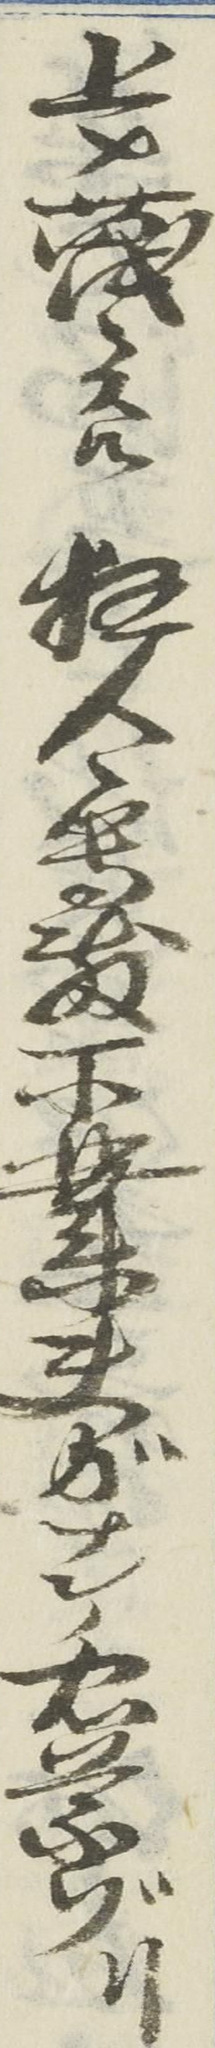上ヲ蔑ニスル狂人二等敷所業夫がナンノ忠義ゾ
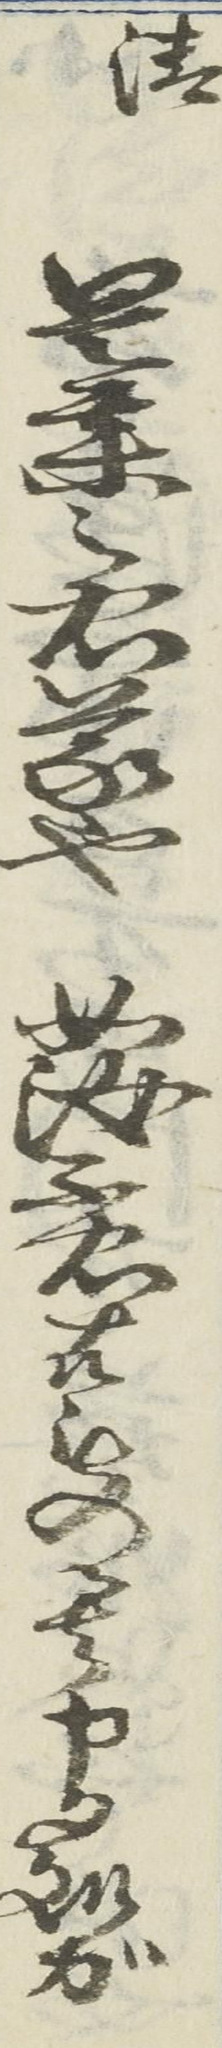清是某之忠義也如汝不忠ナルものニは申タ処ガ
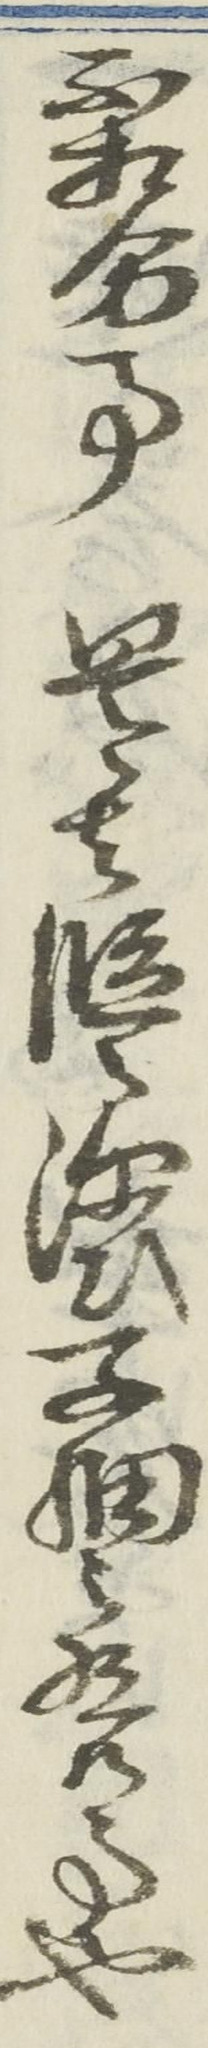不相分事是は段々深ひ子細之有ル事也
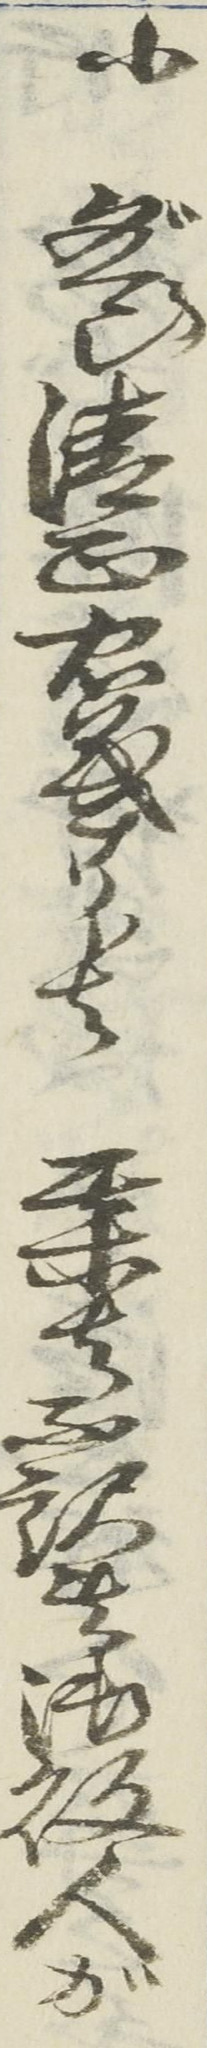小ダマレ清正忠義ナリトは某は不訳共御役人が
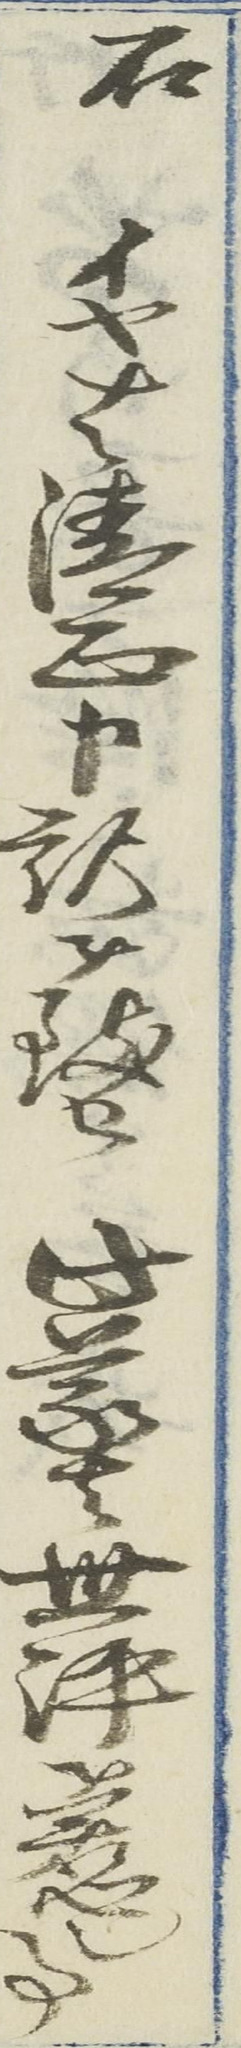石イヤナニ清正申訳ヲ致セ此義は世評ヲ惑シ事
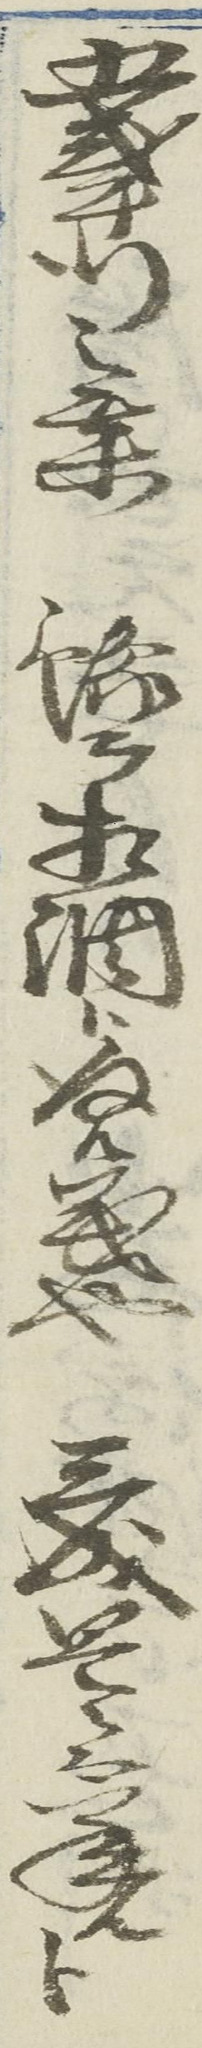五奉行之某豫テ相調ト存候義也三成是ニテ承ルト
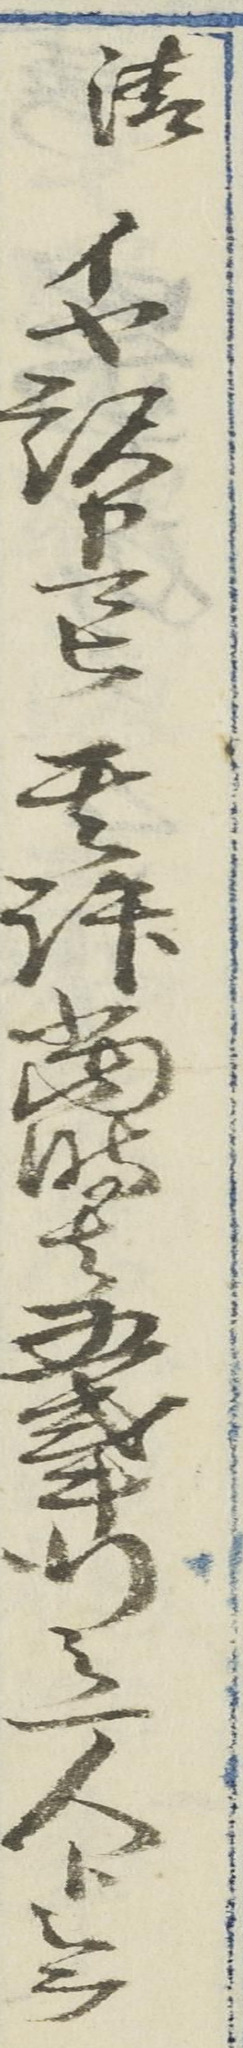清イヤ訳申マヒ其許当時は五奉行之一人トシテ
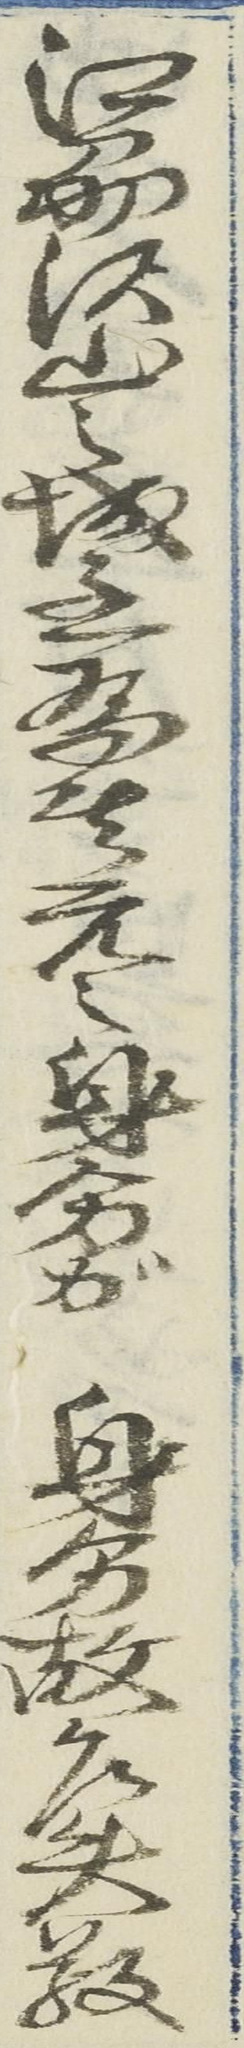江州沢山之城主為共元之身分が身分故乍失敬
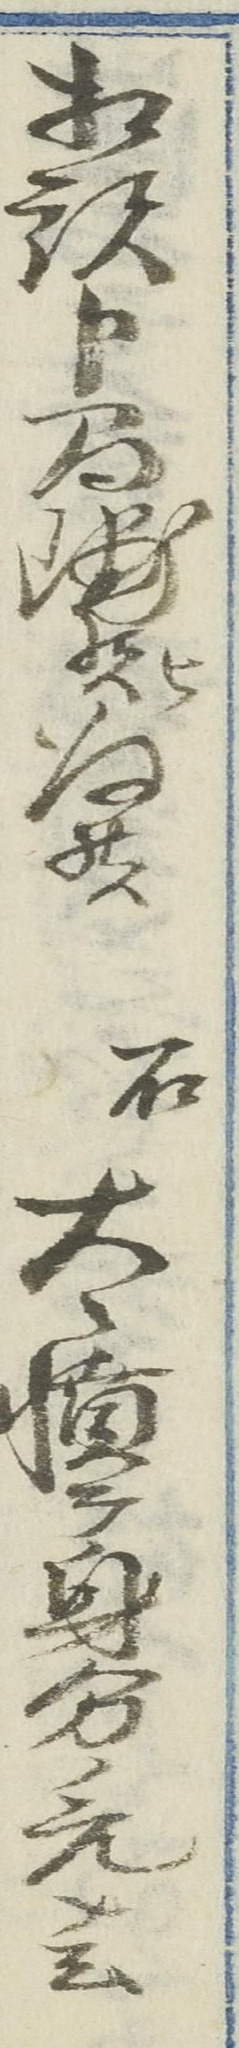相訳申間鋪候被存候石大二憤テ身分之元ヲ云
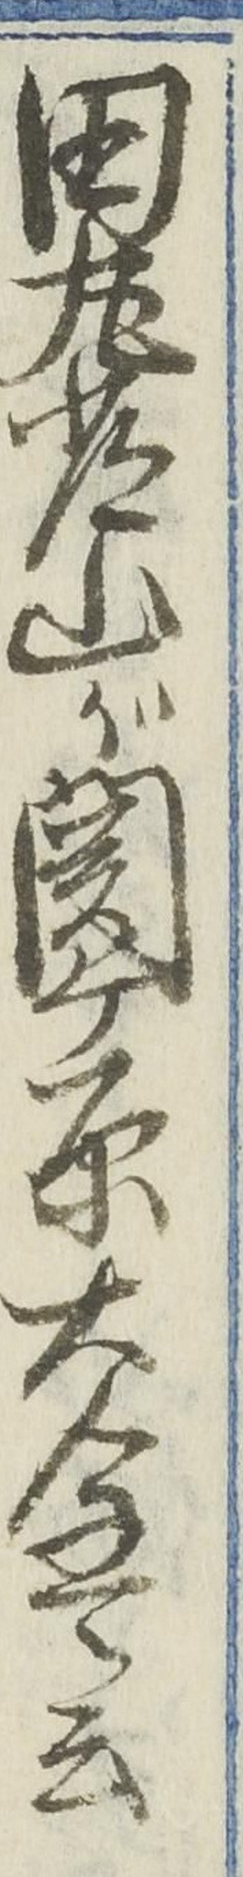田丸常山ガ関ヶ原大全ニ云
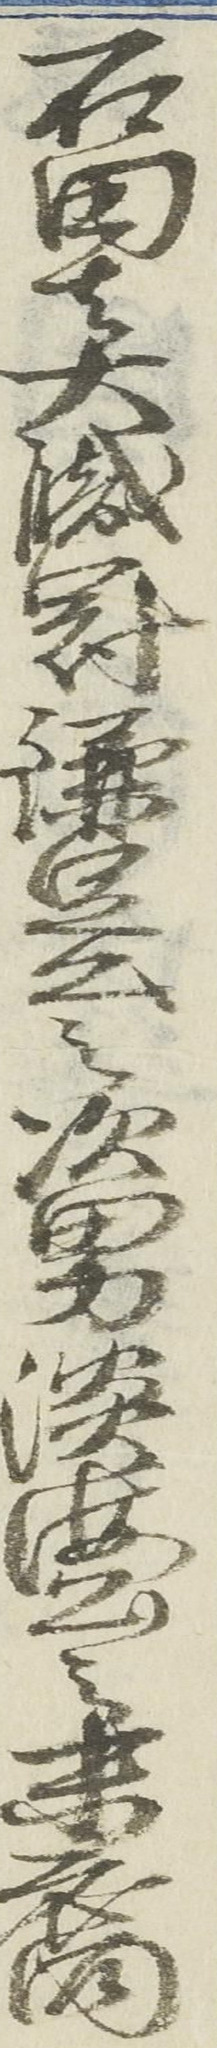石田は大職冠鎌足公之次男淡海公之末裔
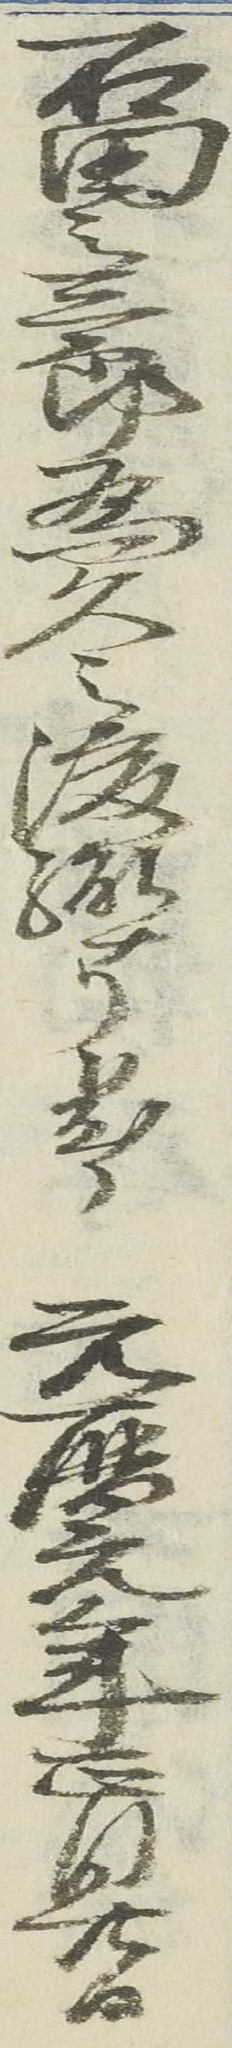石田之三郎為久之後衛ナリト云ウ元暦元年正月廿日
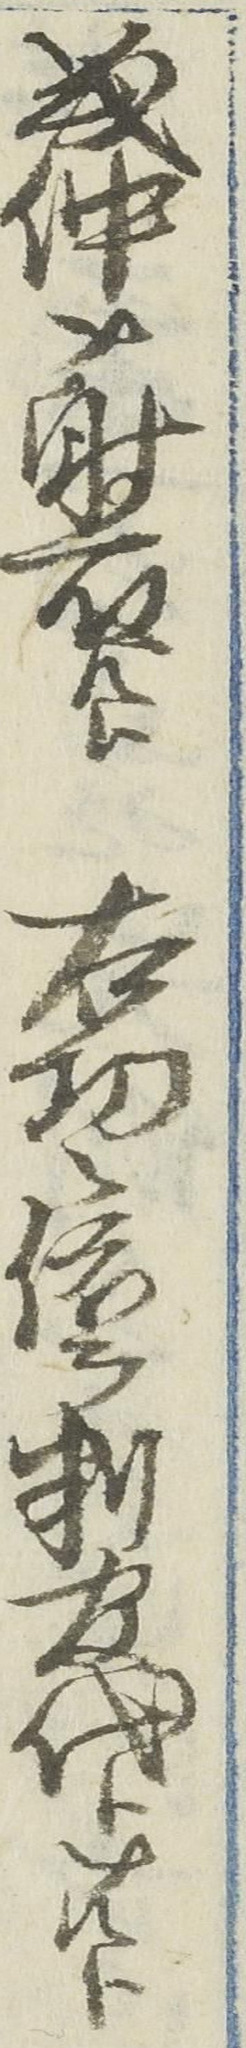義仲ヲ射取ルト右功ニ依テ判官代トナルト
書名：伏水大地震
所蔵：東京大学地震研究所図書室 Earthquake Research Institute Library, The University of Tokyo, JAPAN
